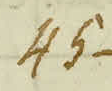45
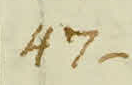47
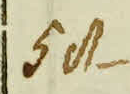58
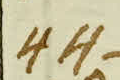44
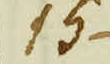15
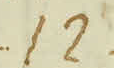12
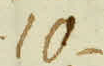10
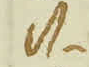8
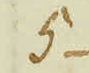5
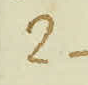2
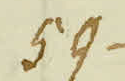59
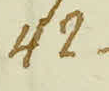42
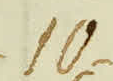10
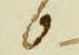6
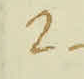2
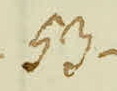53
